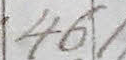46
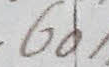60
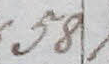58
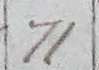71
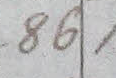86
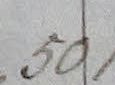50
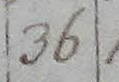36
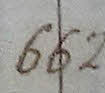66
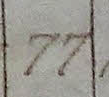77
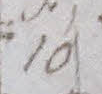10
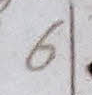6
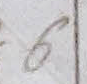6
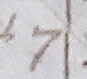7
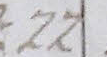22
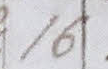16
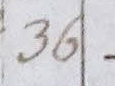36
